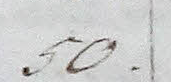50.
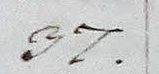37.
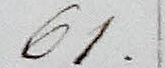61.
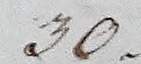30
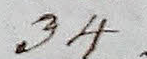34
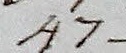47
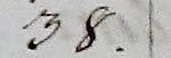38.
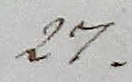27
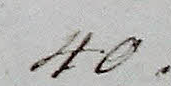40
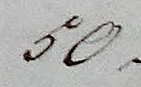50
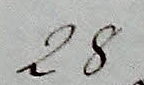28
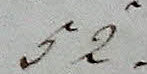52
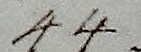44
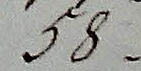58
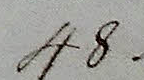48
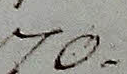70
